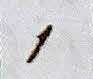1
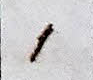1
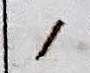1
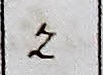2
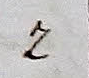2
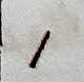1
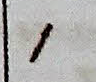1
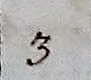3
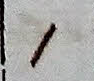1
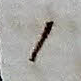1
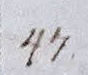47
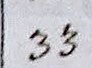33
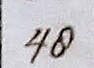48
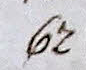62
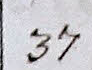37
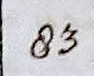83
